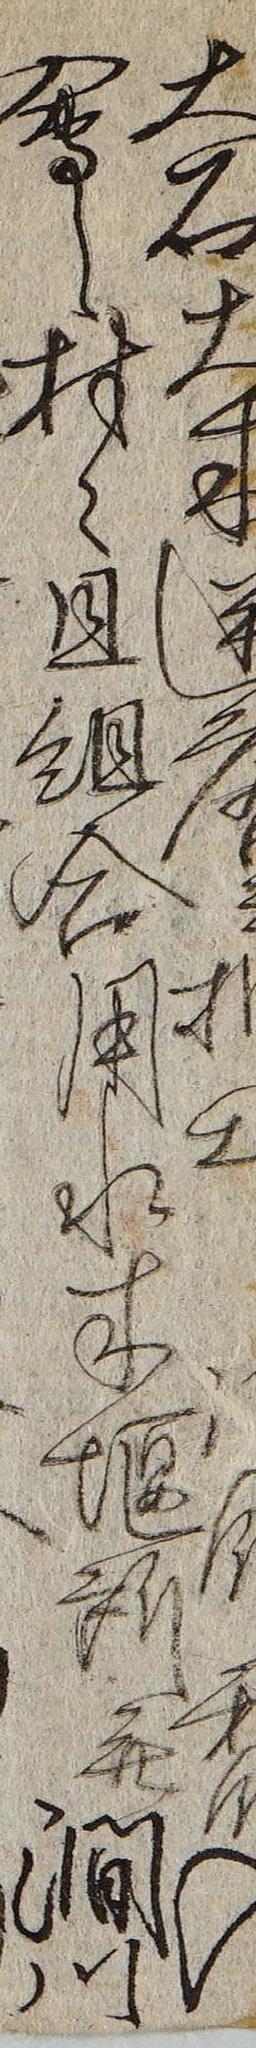会の村々且組合用水木堰所幷澗川
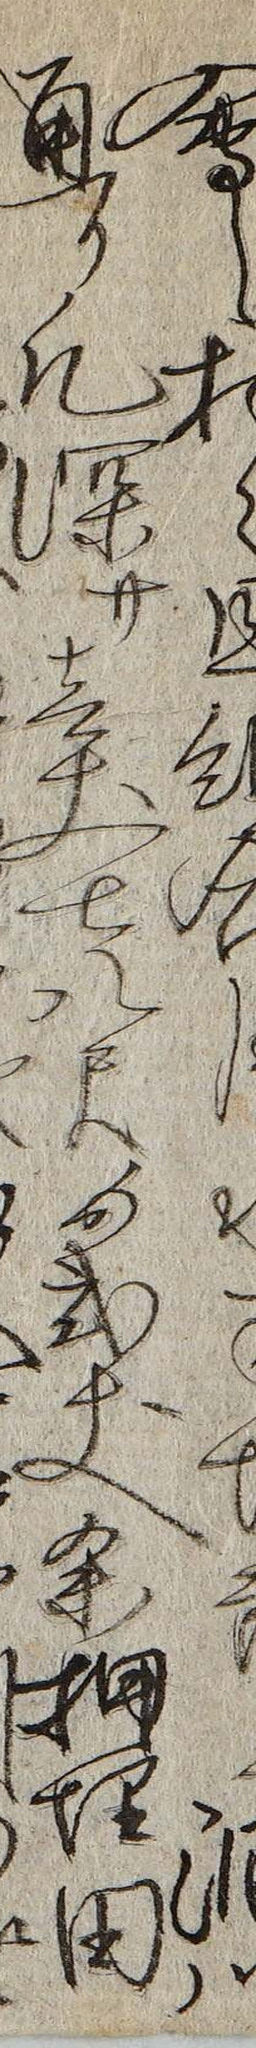通り凡深さ一丈七八尺より二丈余押埋田
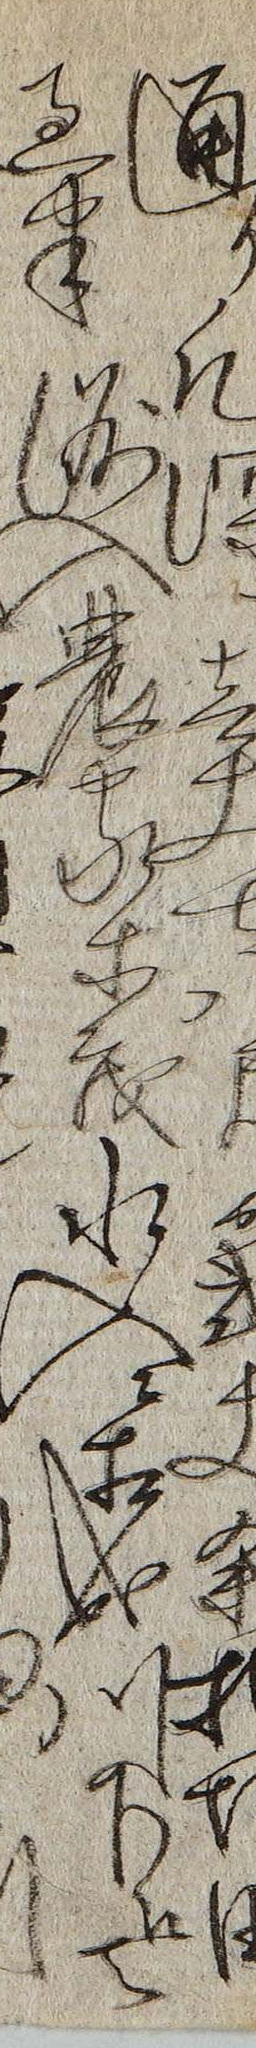過半落入農家等も水入に相成川下へは
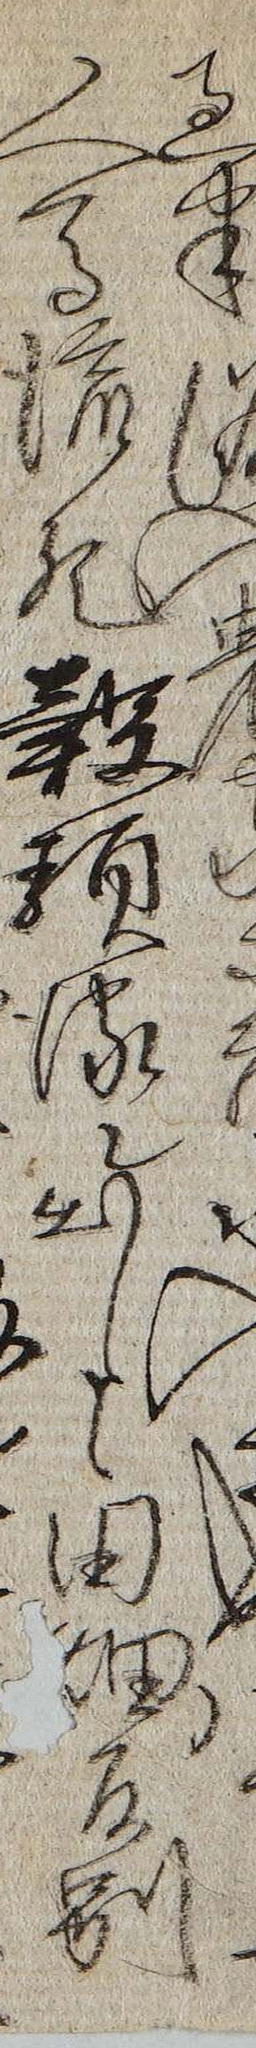人馬流候歟穀類流れ出して田畑反別
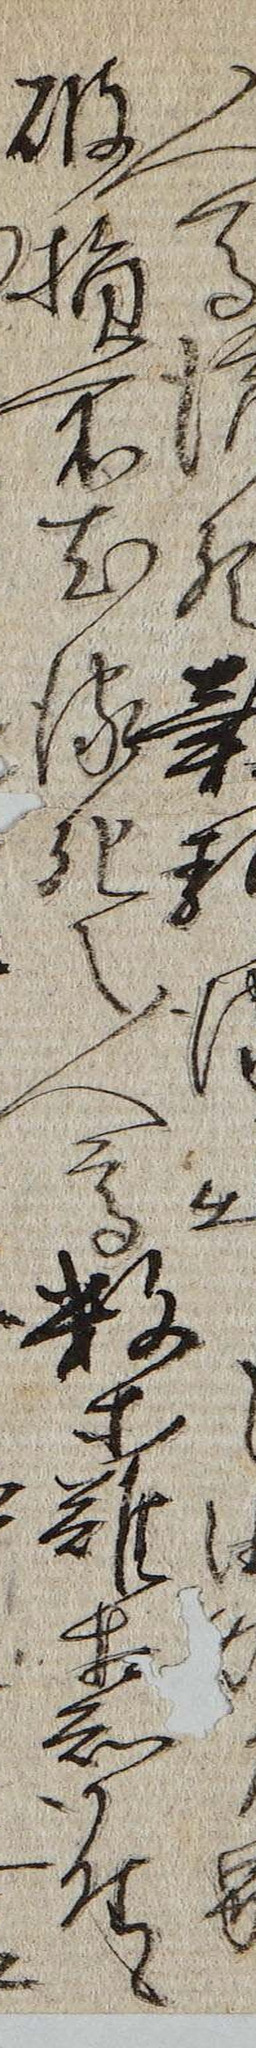破損所尤流死し人馬数等難相知御座候
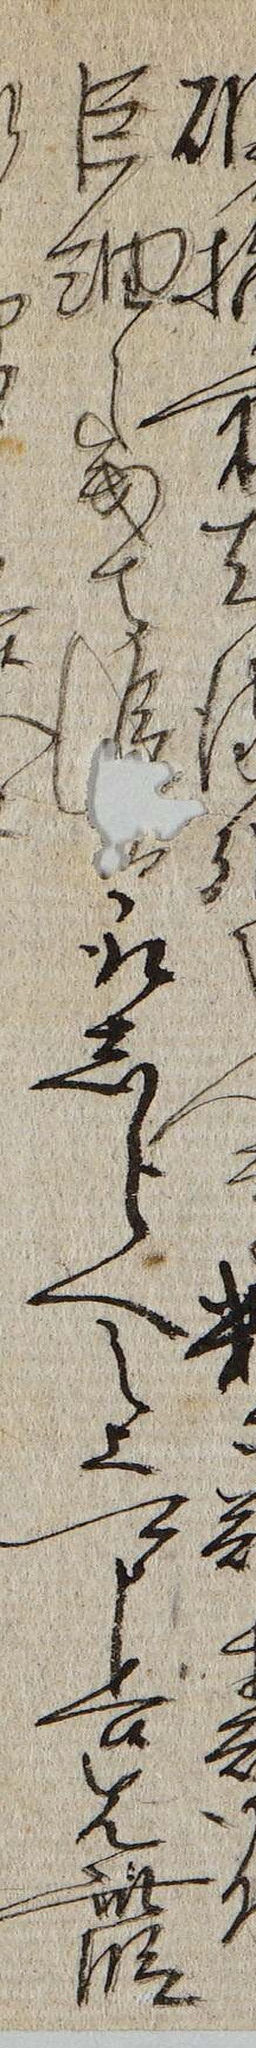巨細の義は追て取しらべの上可申上候先此段
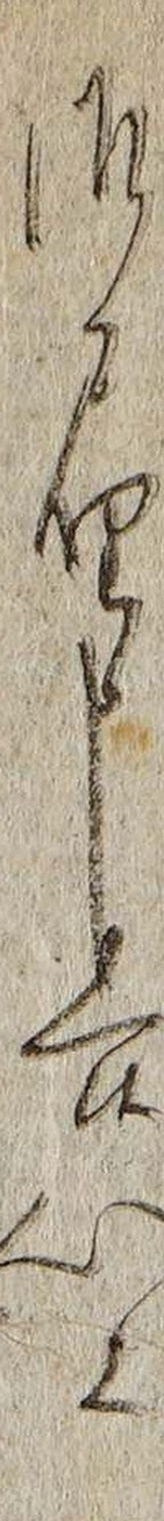御届申上候以上
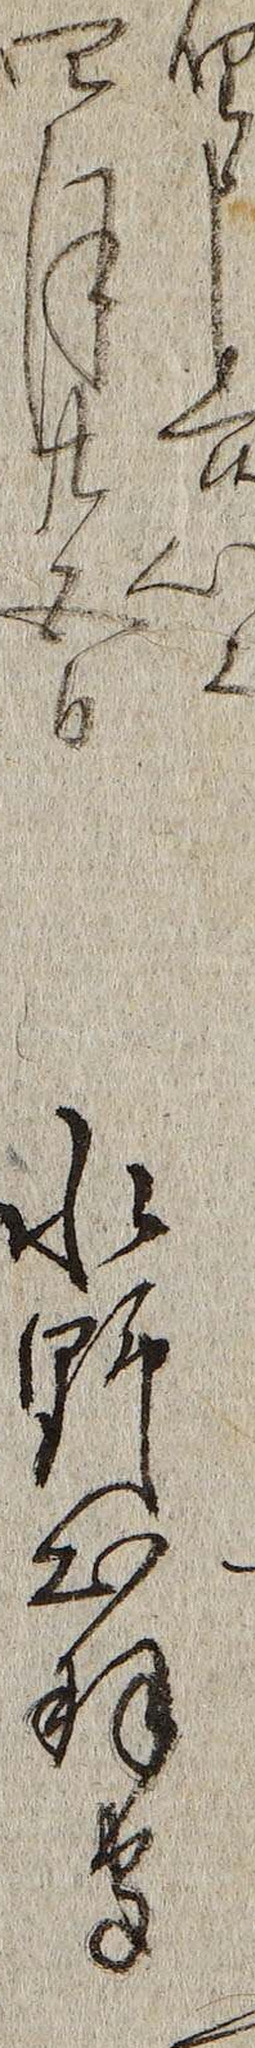四月二十五日水野出羽守
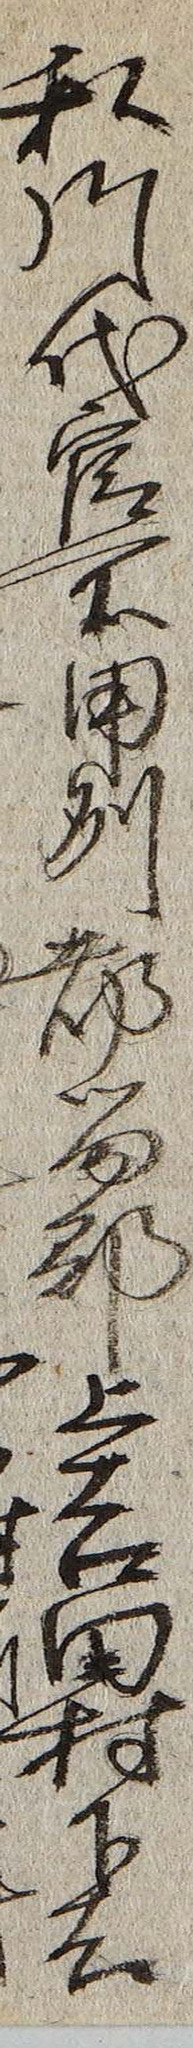私御代官所甲州都留郡上吉田村下吉
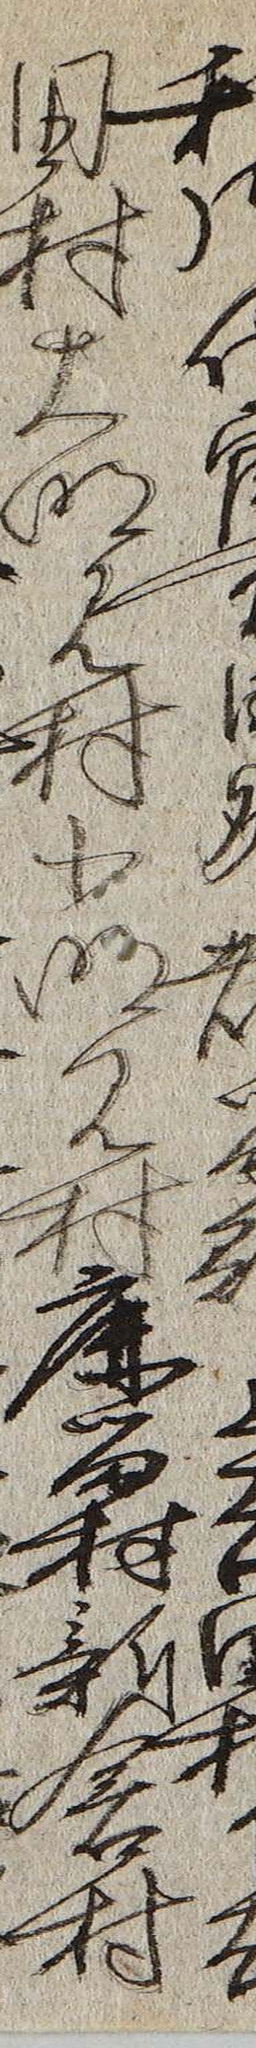田村大明見村小明見村鹿留村新倉村
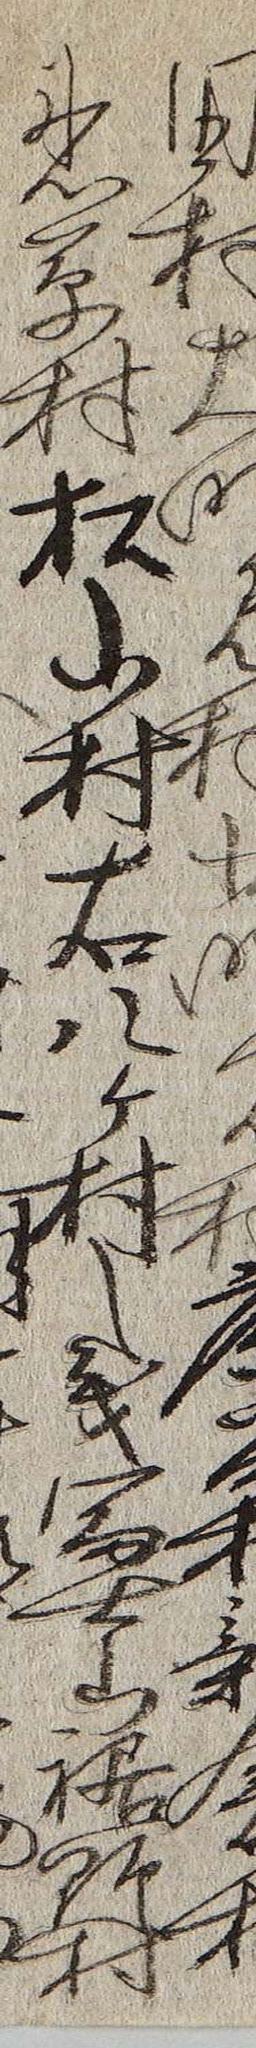忍草村松山村右八ケ村の義富士山裾野村
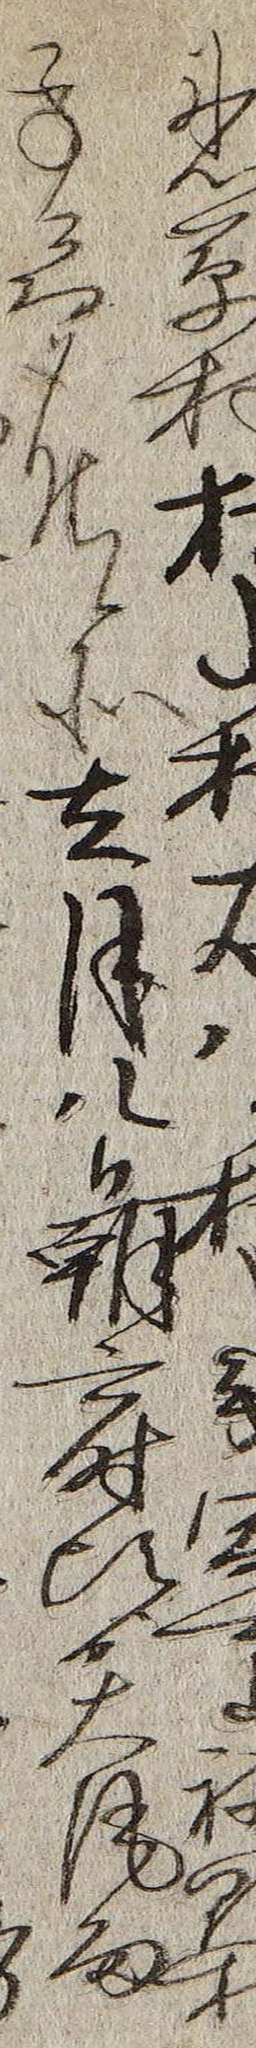方にて御座候所去月八日朝六時頃より大風雨
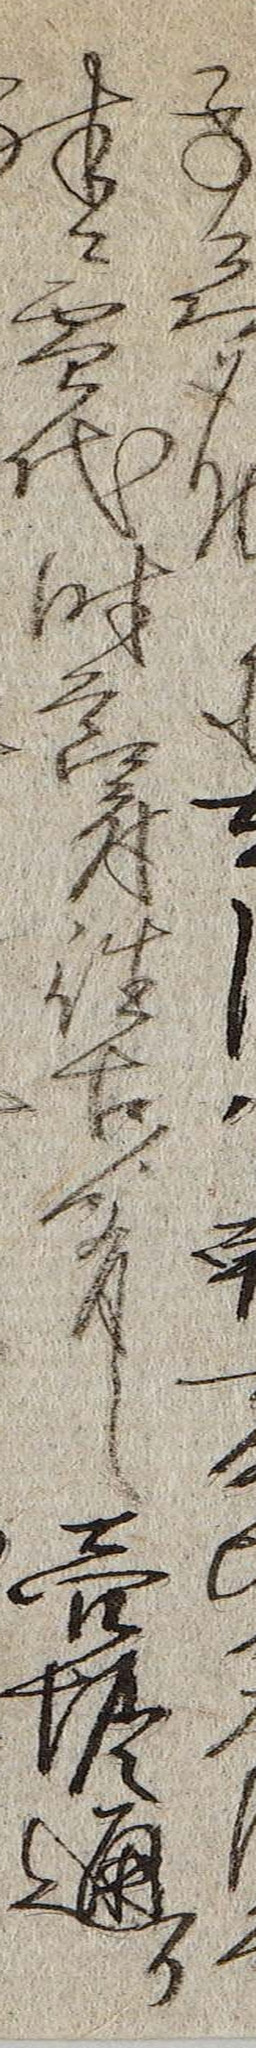殊に雪代時節に付往古より有之通り
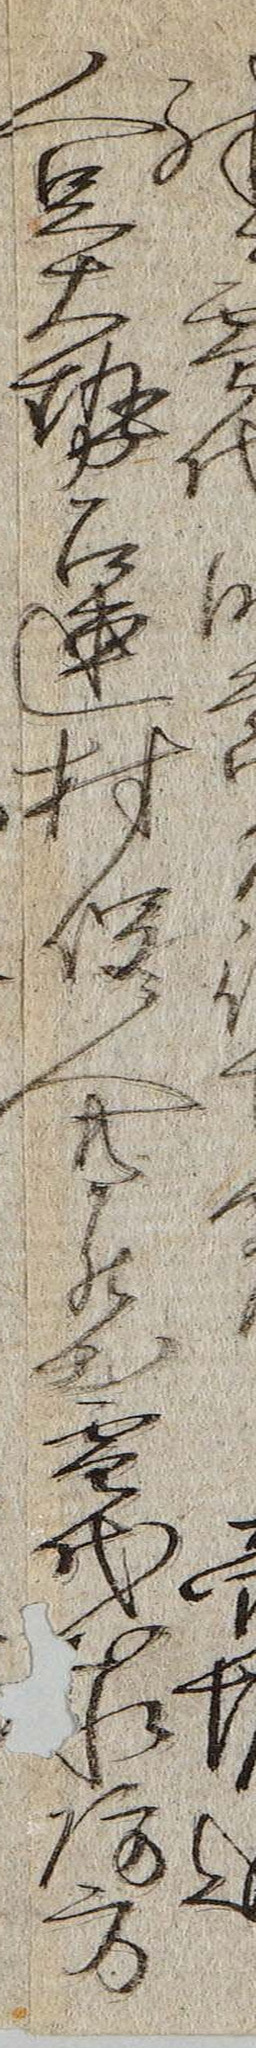人足大勢召連村役人ども罷出雪代相防方
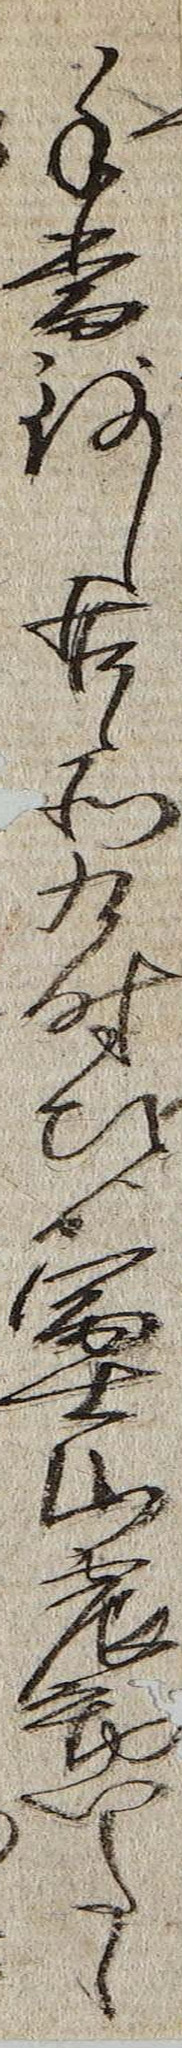手当致し居候所九時頃より富士山震動いたし
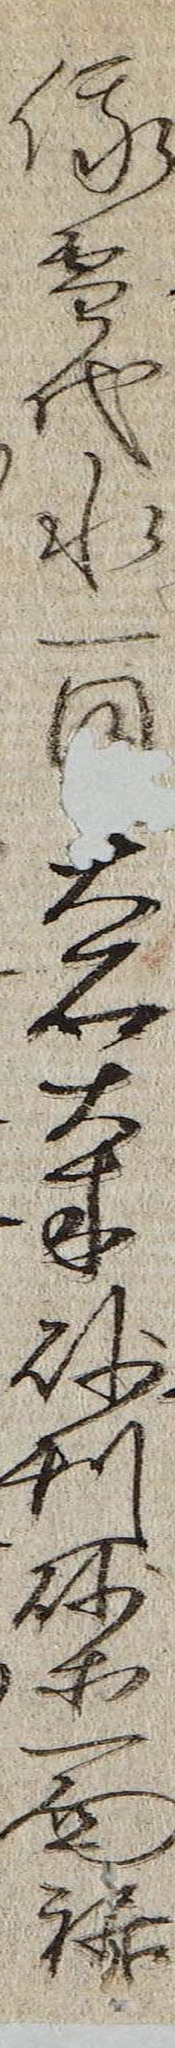俄雪代水一大石大木砂利砂等一面裾
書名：能登国清兵衛異国江漂流之始末
